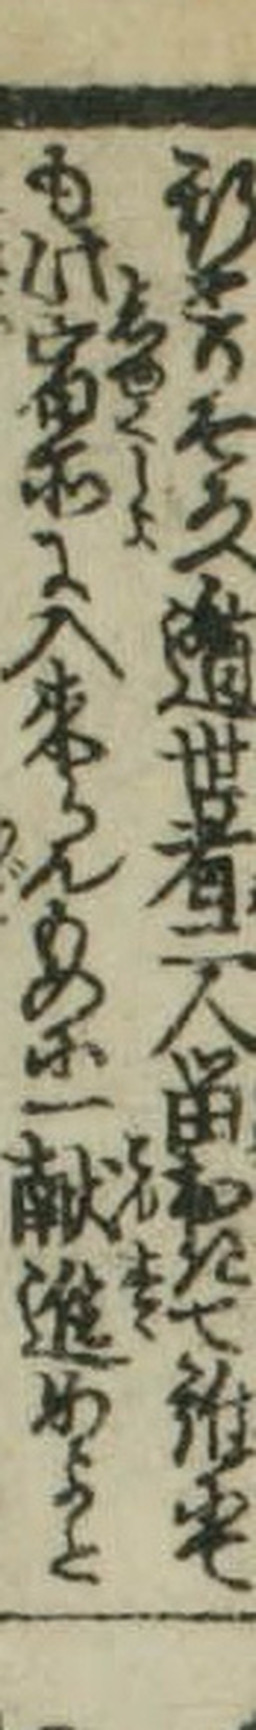も此宿所に入来らんものに一献進めよと
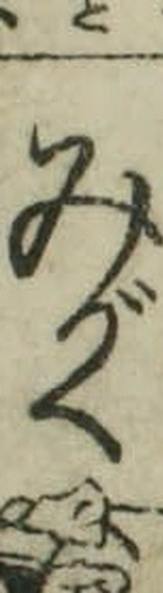みがく
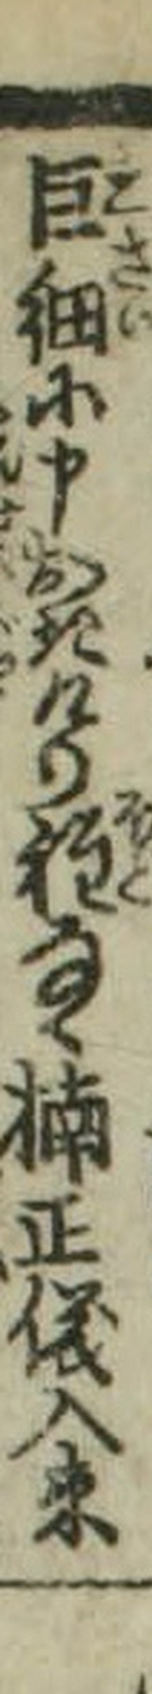巨細に申おきけり程なく楠正儀入来
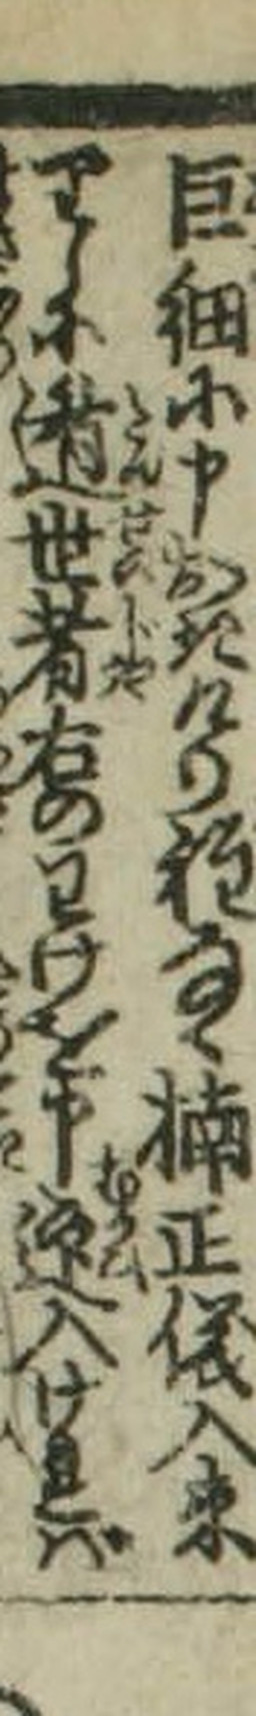りしに遁世者右のわけを申迎入ければ
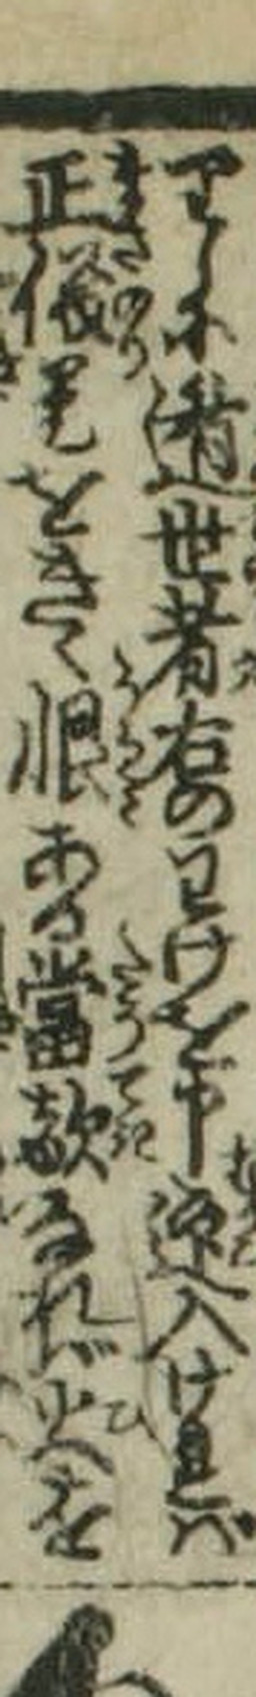正儀是をきゝ恨ある当敵なれば火を
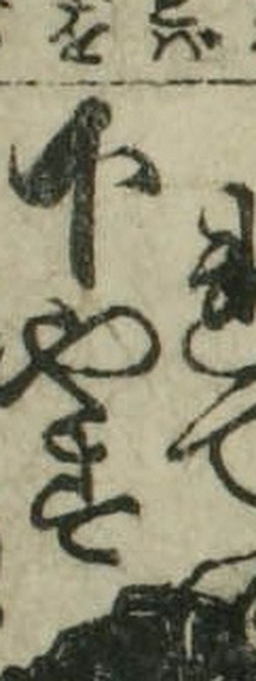下やす
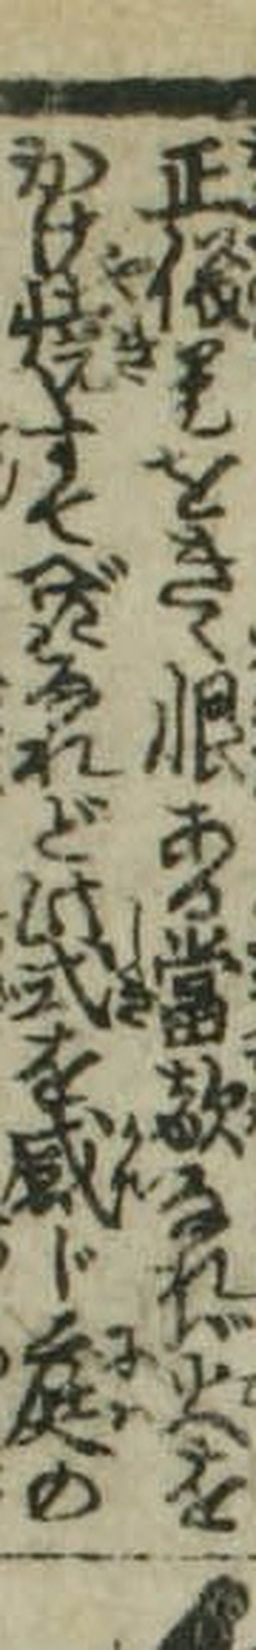かけ焼すてべきなれど此式を感じ庭の
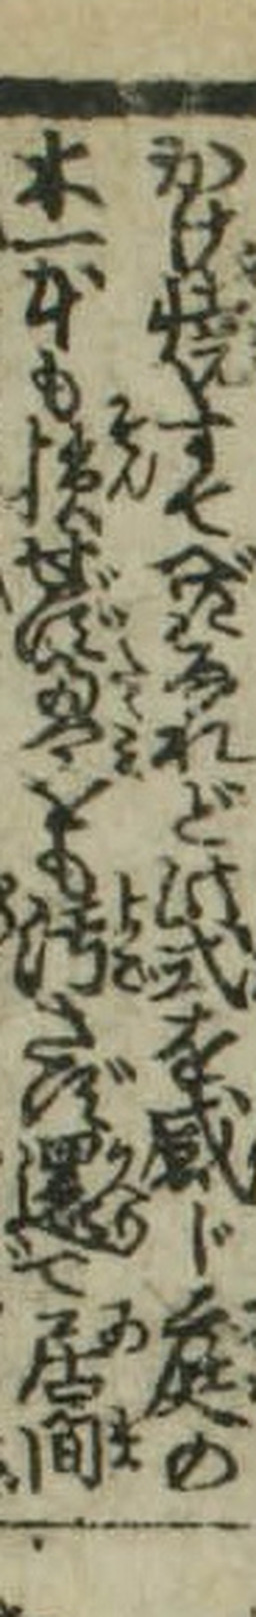木一本も損ぜず畳をも汚さず還て居間
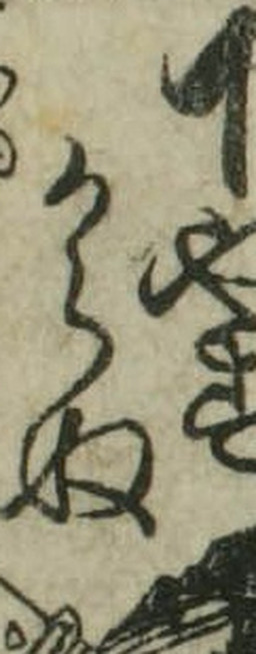からぬ
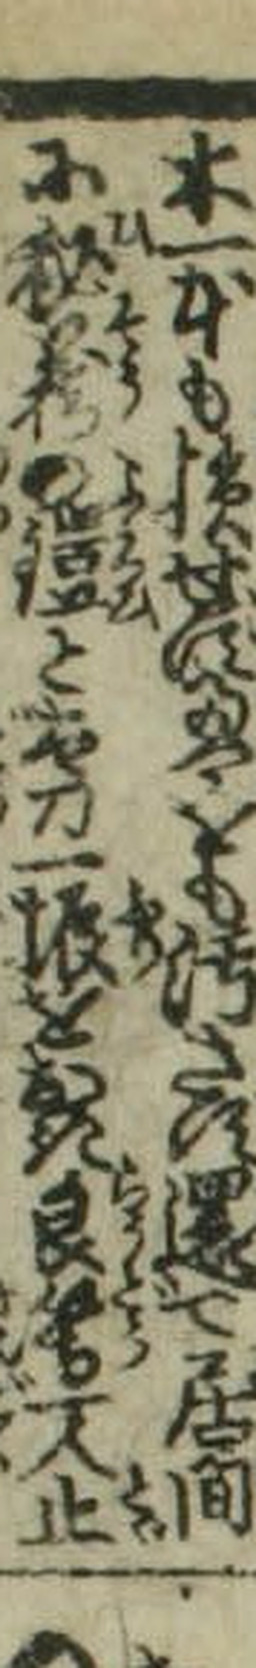に秘蔵の鎧と太刀一振をおき良等一人止
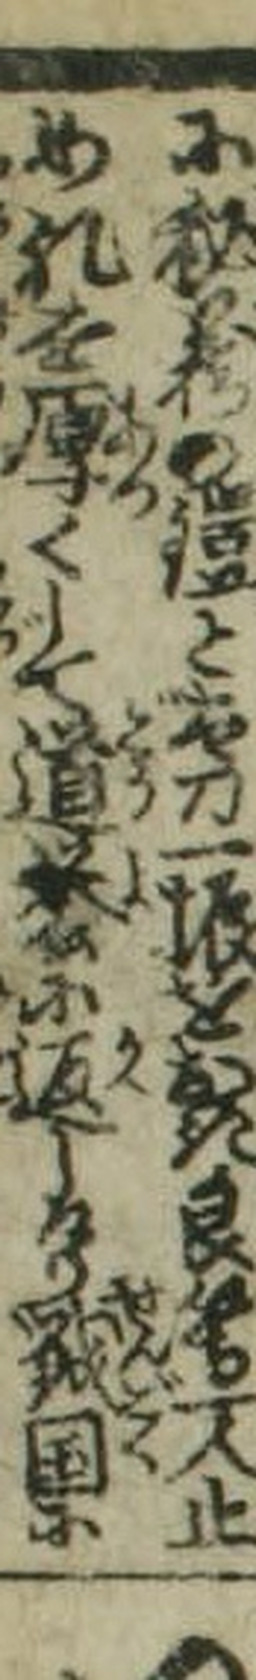め礼を厚くして道誉に返しけり戦国に
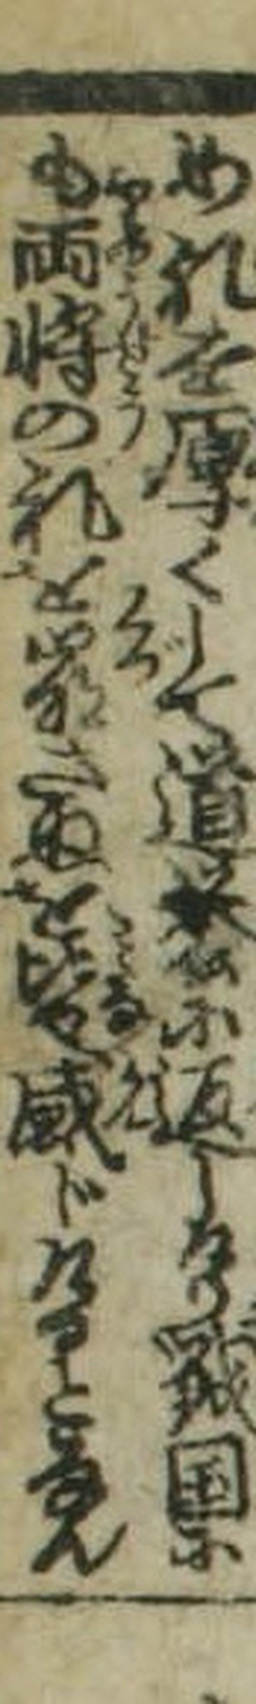も両将の礼を崩さぬを皆感じけるとなん
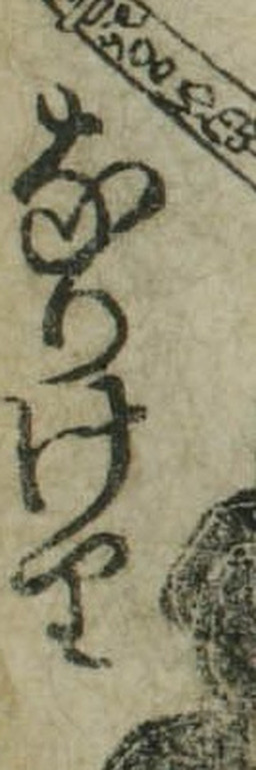なりけり

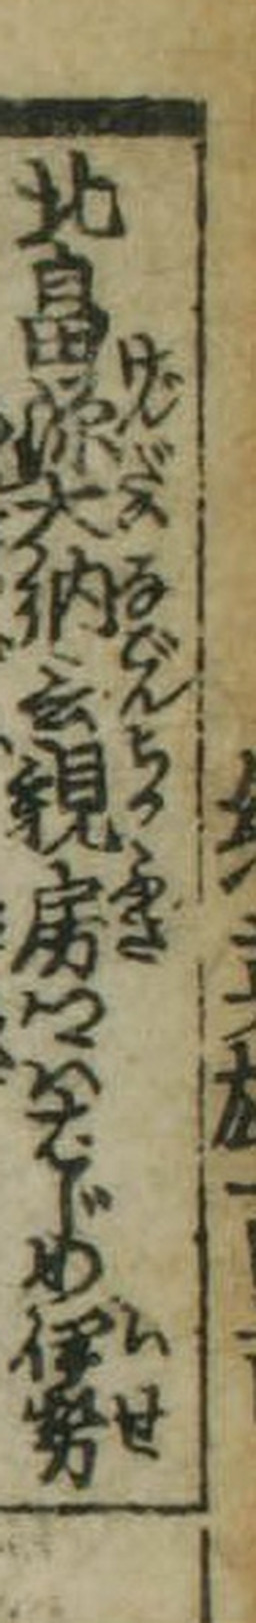北畠源大納言親房卿ははじめ伊勢
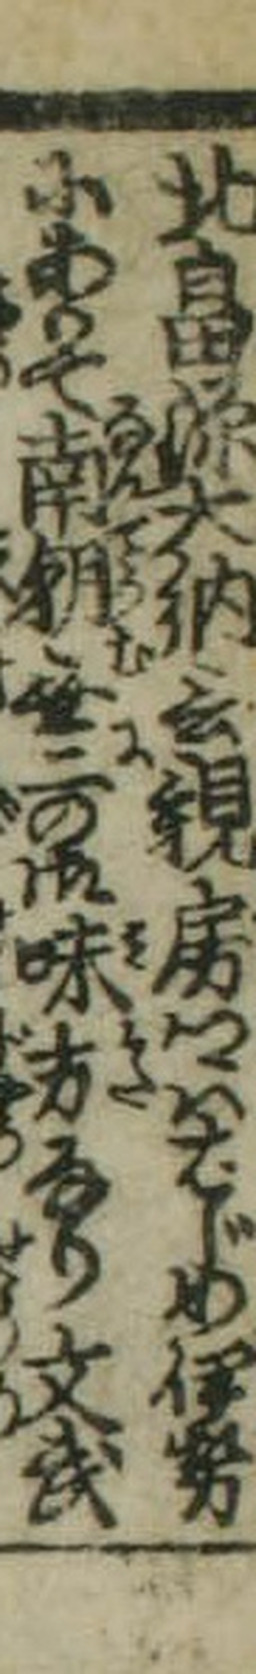にありて南朝無二の御味方なり文武
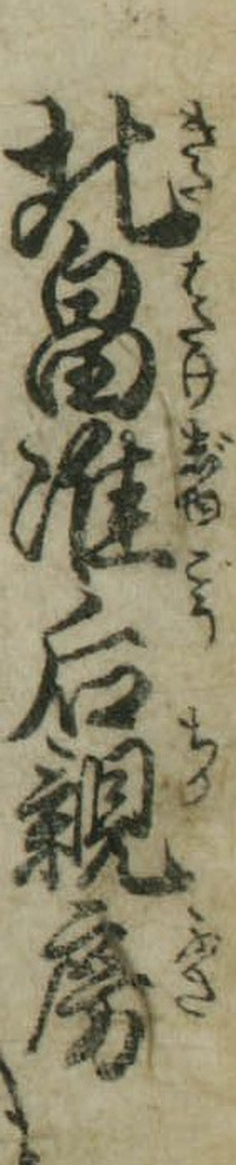北畠准后親房
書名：續英雄百人一首
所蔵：東京学芸大学附属図書館
